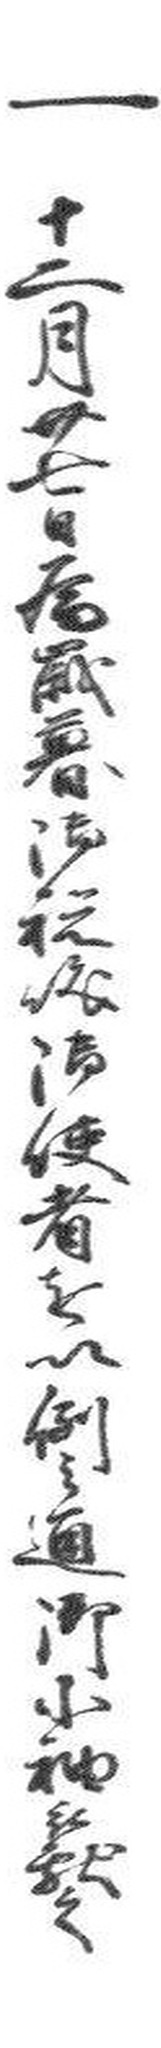一十二月廿七日為歳暮御祝儀御使者を以例之通御小袖被献之
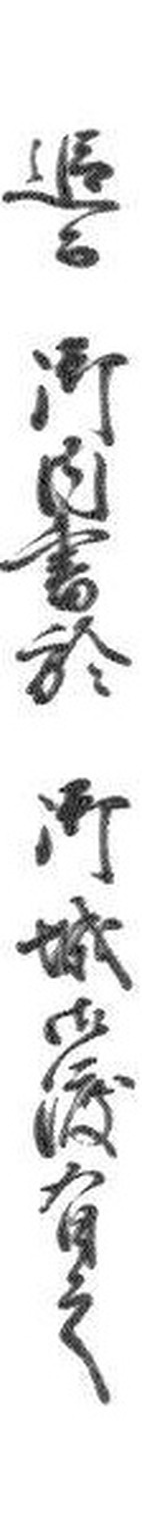追而御内書於御城御渡有之

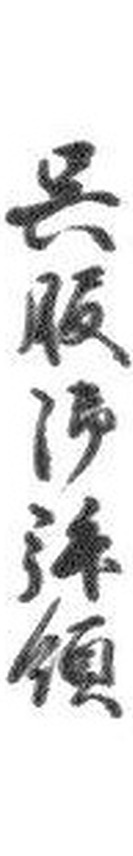呉服御拝領
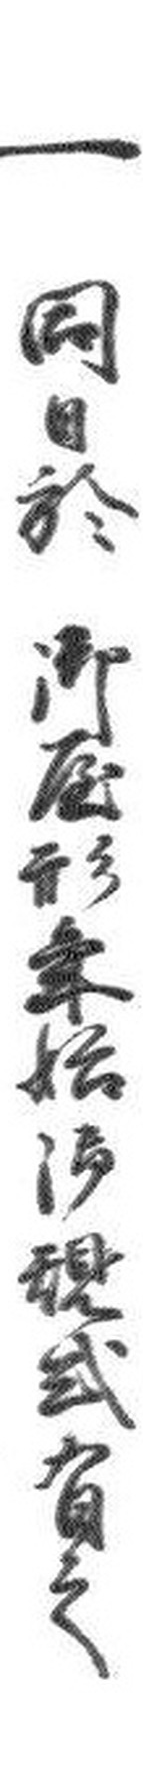一同日於御屋形年始御規式有之
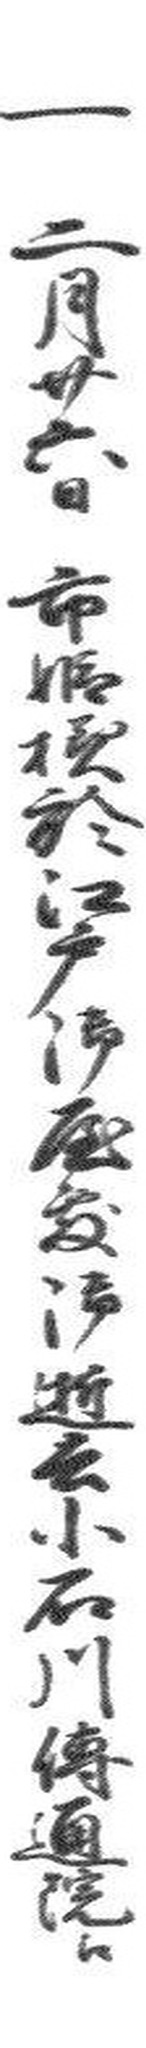一二月廿六日市姫様於江戸御屋敷御逝去小石川伝通院江
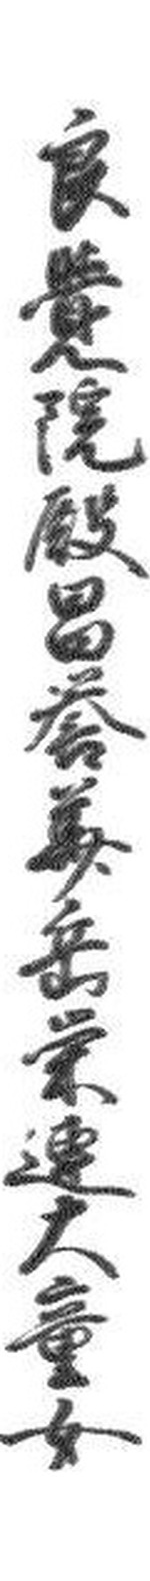良覚院殿昌誉万岳栄連大童女
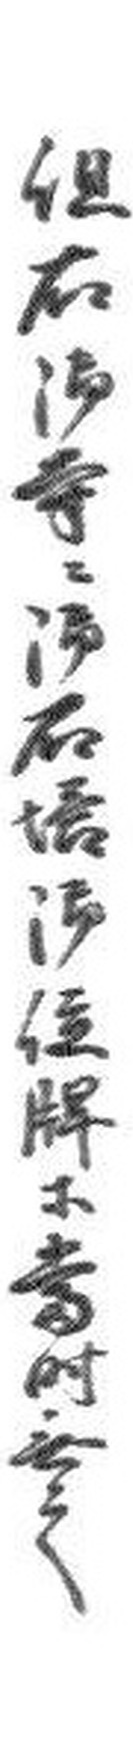但右御寺ニ御石塔御位牌等当時無之

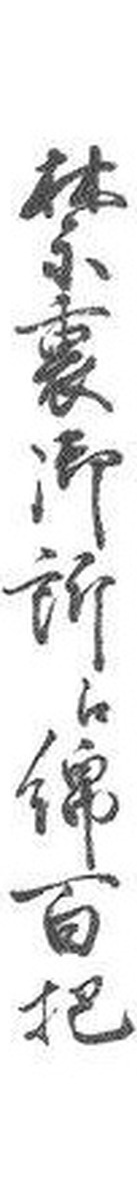禁裏御所江綿百把
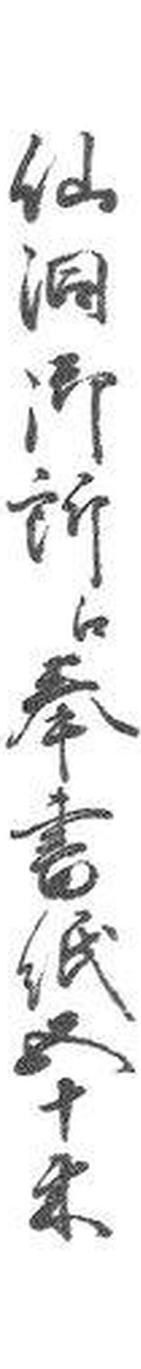仙洞御所江奉書紙五十束
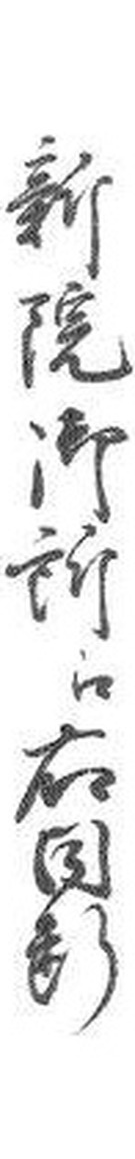新院御所江右同断
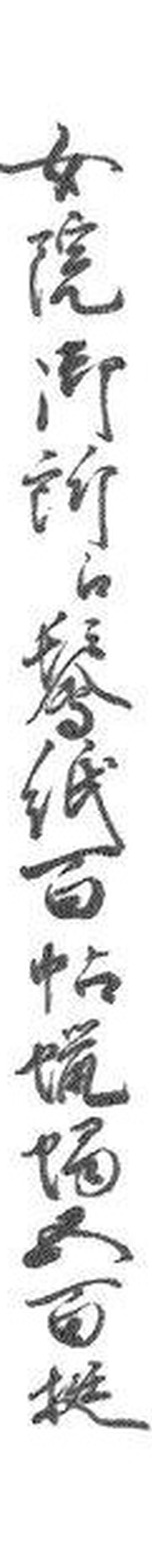女院御所江鬠紙百帖蠟燭五百挺
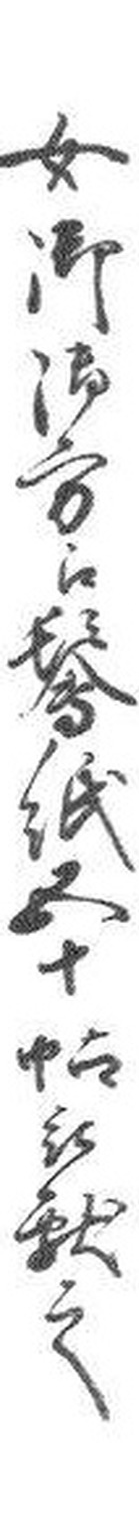女御御方江鬠紙五十帖被献之
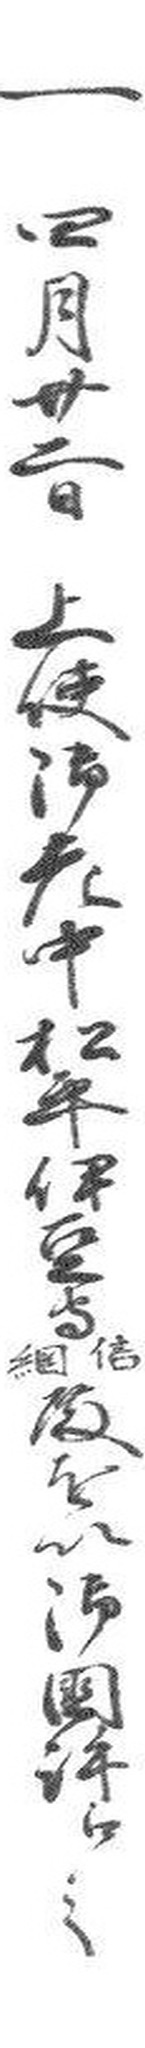一四月廿二日上使御老中松平伊豆守信綱殿を以御国許江之
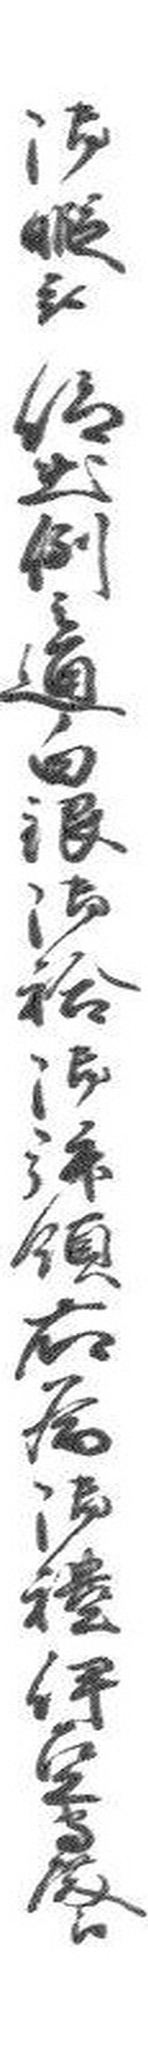御暇被仰出例之通白銀御袷御拝領右為御礼伊豆守殿江
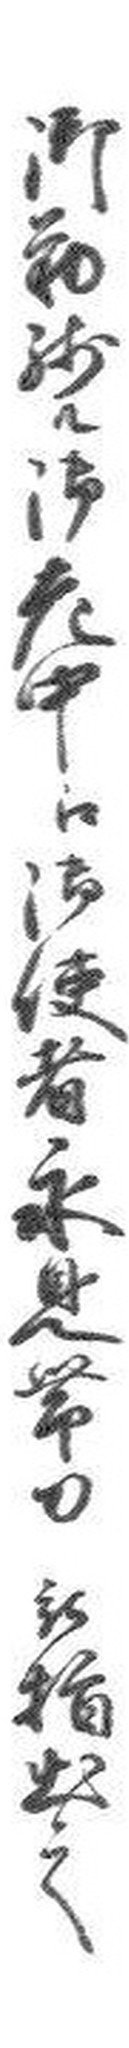御勤残ル御老中江御使者永見帯刀被指出之
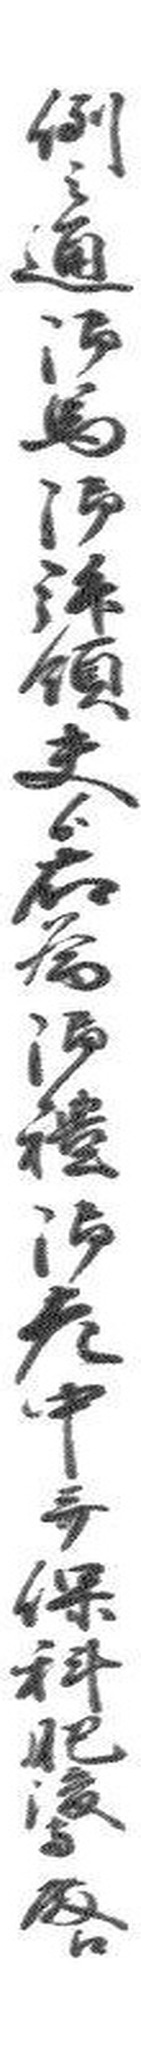例之通御馬御拝領夫ゟ右為御礼御老中并保科肥後守殿江
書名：家譜 六 光通公 従万治三年到寛文三年
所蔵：福井県文書館 Fukui Prefectural Archives
